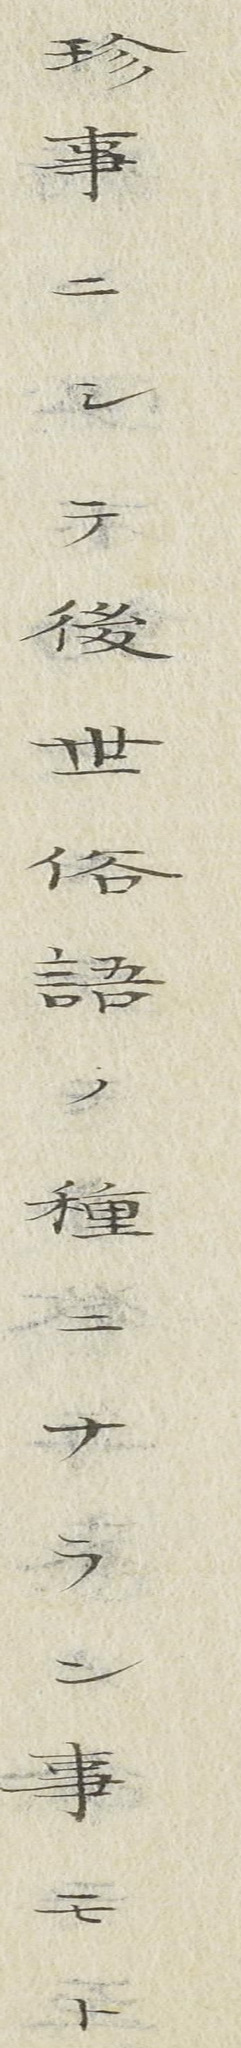珍事ニシテ後世俗語ノ種ニナラン事モト
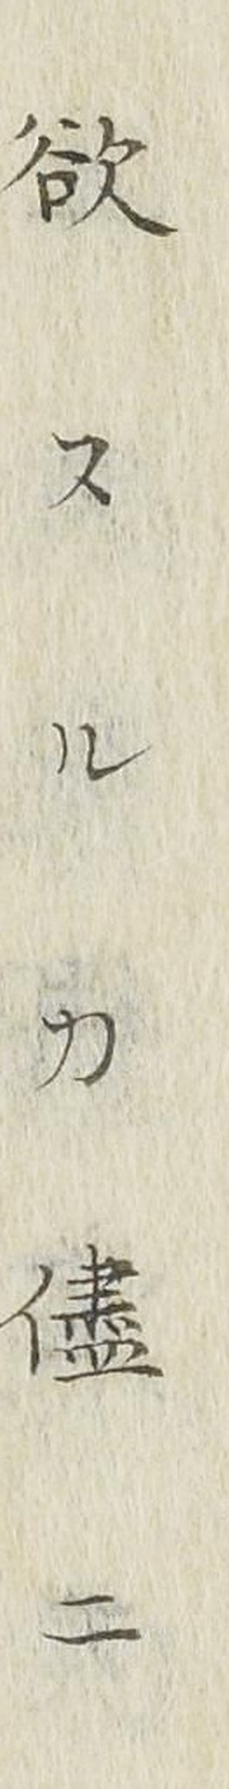欲スルカ侭ニ
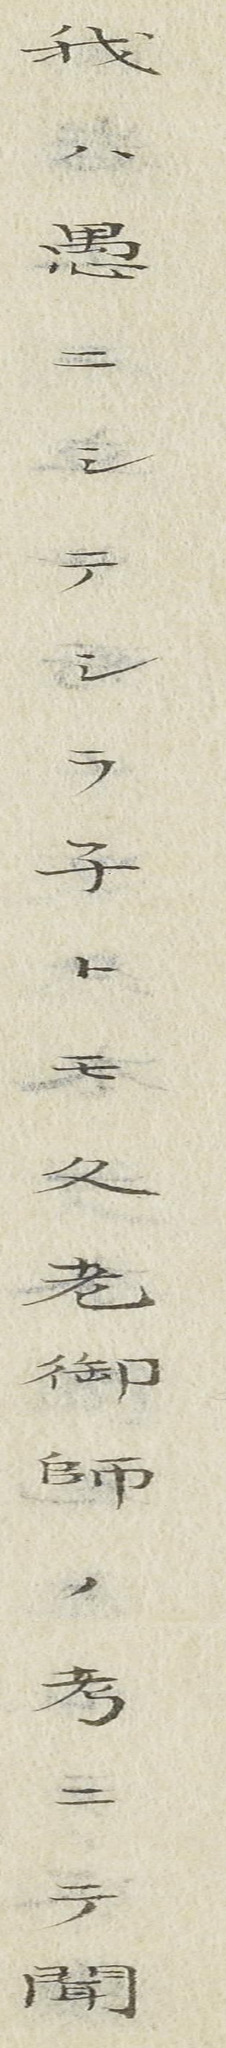我ハ愚ニシテシラ子トモ久老御師ノ考ニテ聞
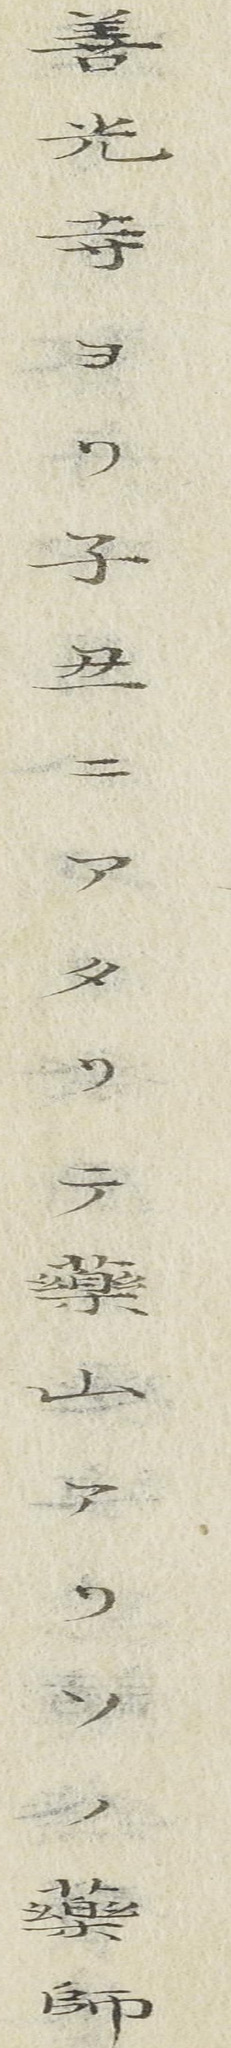善光寺ヨリ子丑ニアタリテ薬山アリソノ薬師
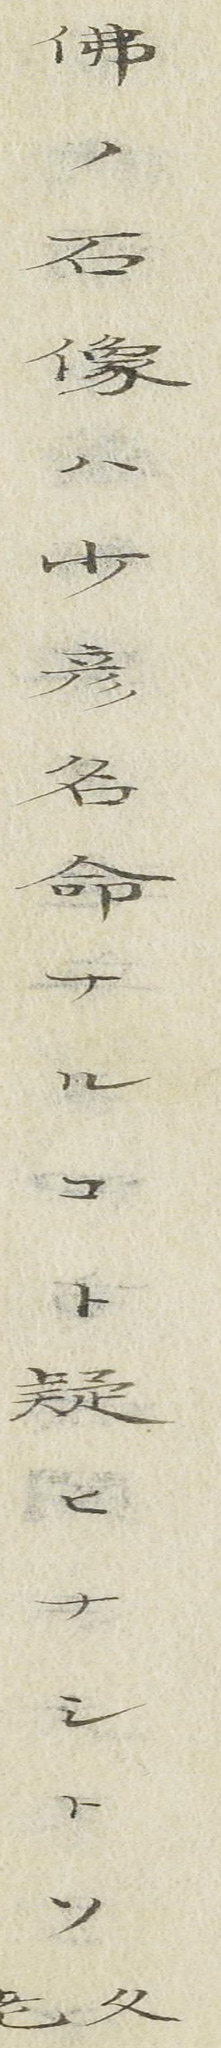仏ノ石像ハ少彦名命ナルコト疑ヒナシトソ久老

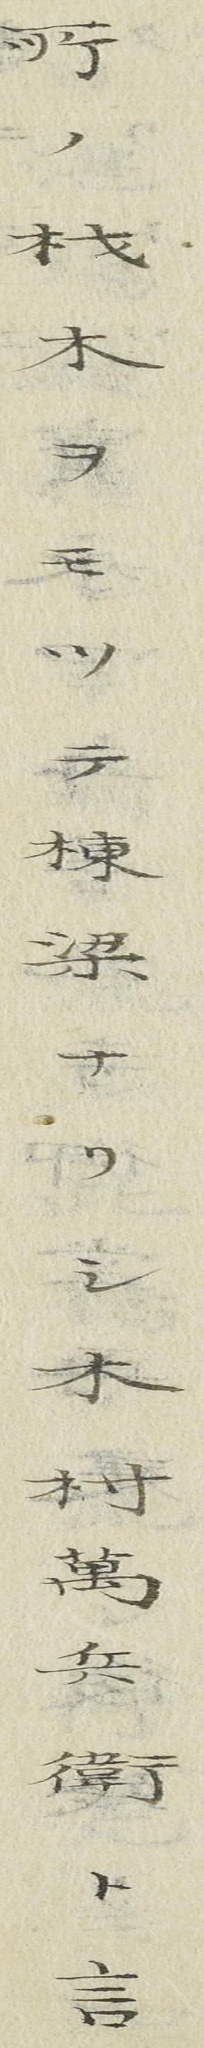所ノ材木ヲモツテ棟梁ナリシ木村万兵衛ト言
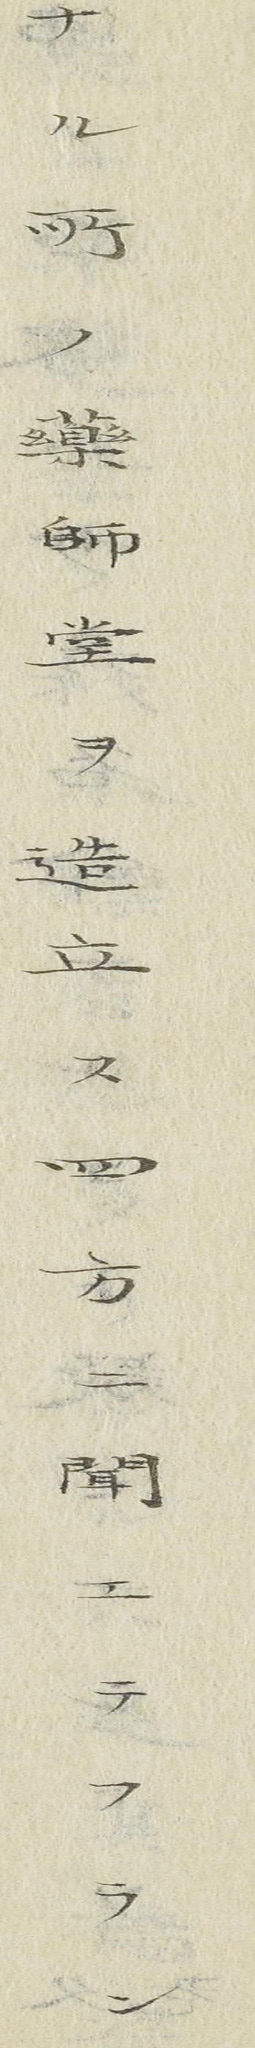ナル所ノ薬師堂ヲ造立ス四方ニ聞エテフラン
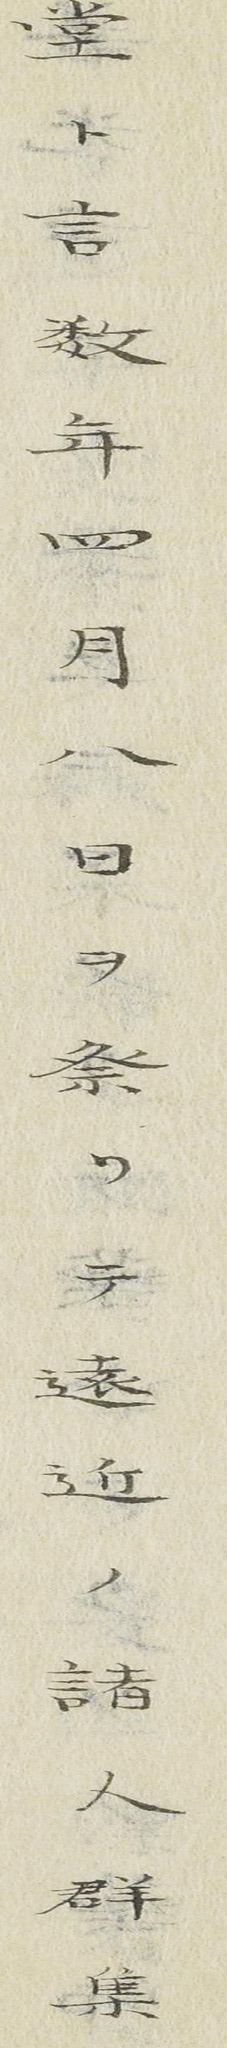堂ト言数年四月八日ヲ祭リテ遠近ノ諸人群集
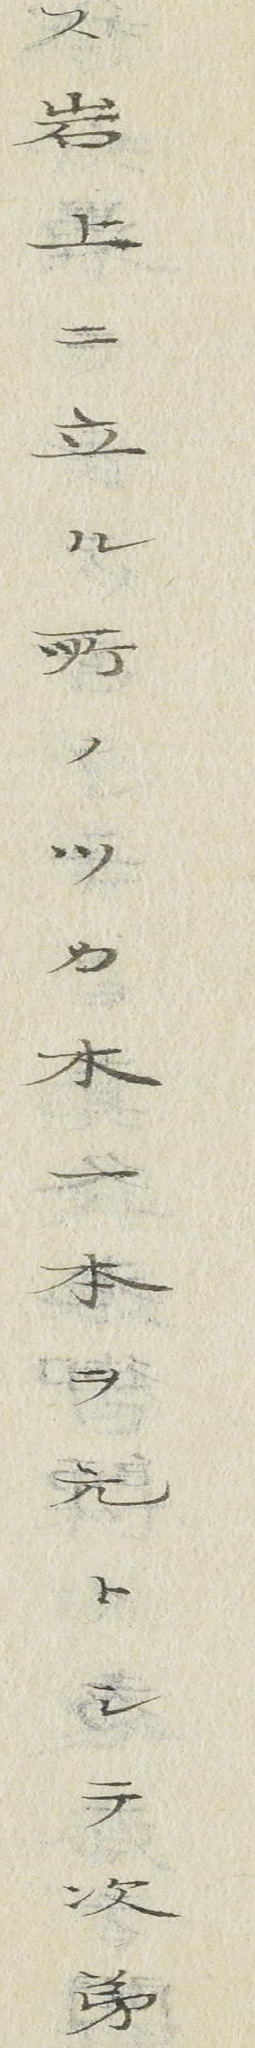ス岩上ニ立ル所ノツカ木一本ヲ元トシテ次第
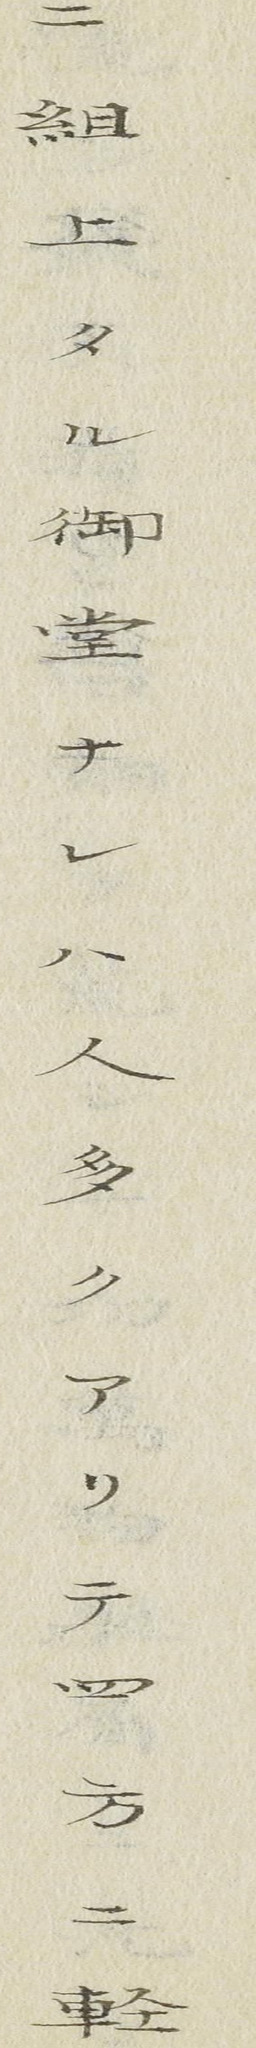ニ組上タル御堂ナレハ人多クアリテ四方ニ軽
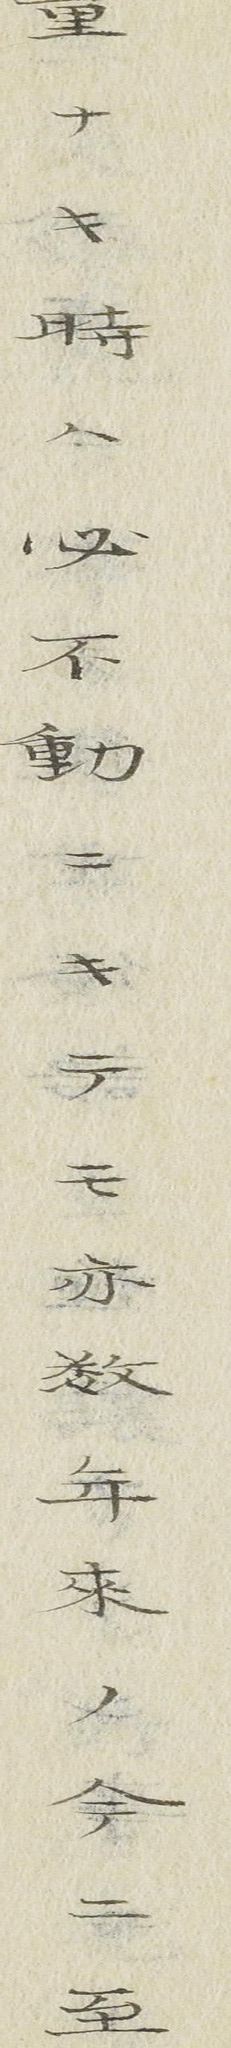重ナキ時ハ必不動ニキテモ亦数年来ノ今ニ至
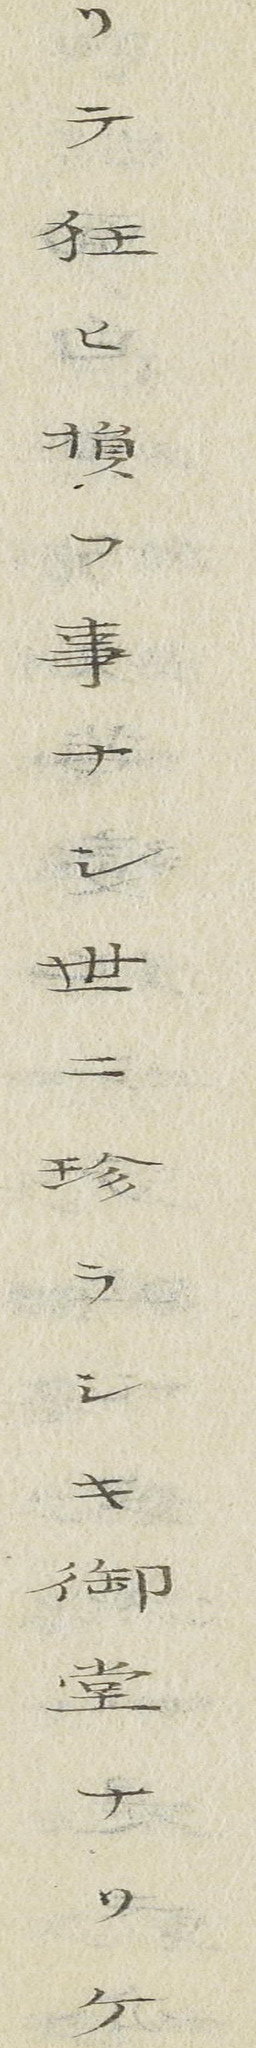リテ狂ヒ損フ事ナシ世ニ珍ラシキ御堂ナリケ
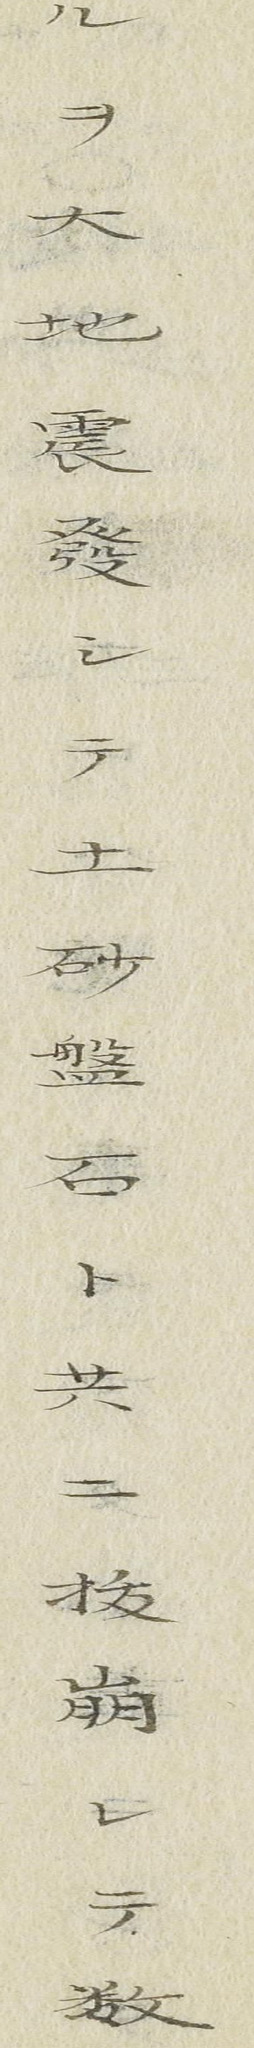ルヲ大地震発シテ土砂盤石ト共ニ抜崩レテ数
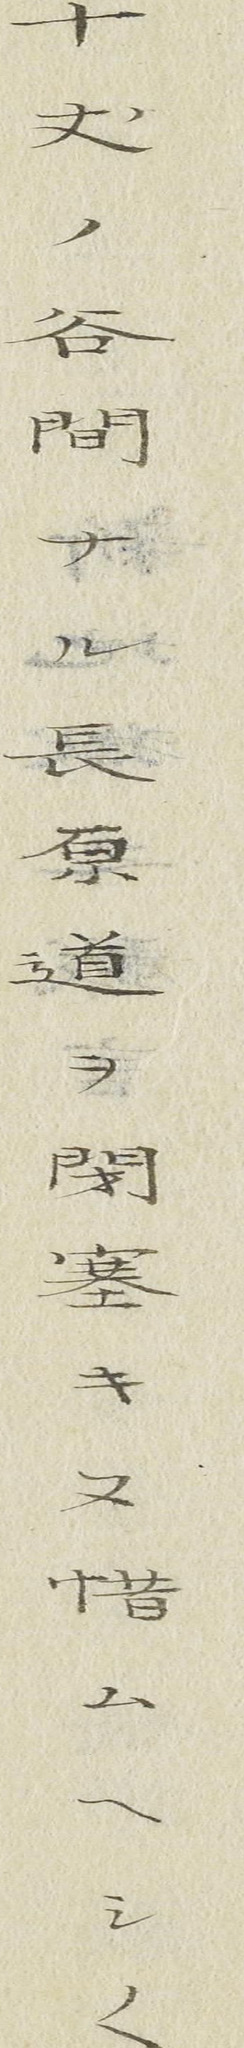十丈ノ谷間ナル長原道ヲ閉塞キヌ惜ムヘシ〱
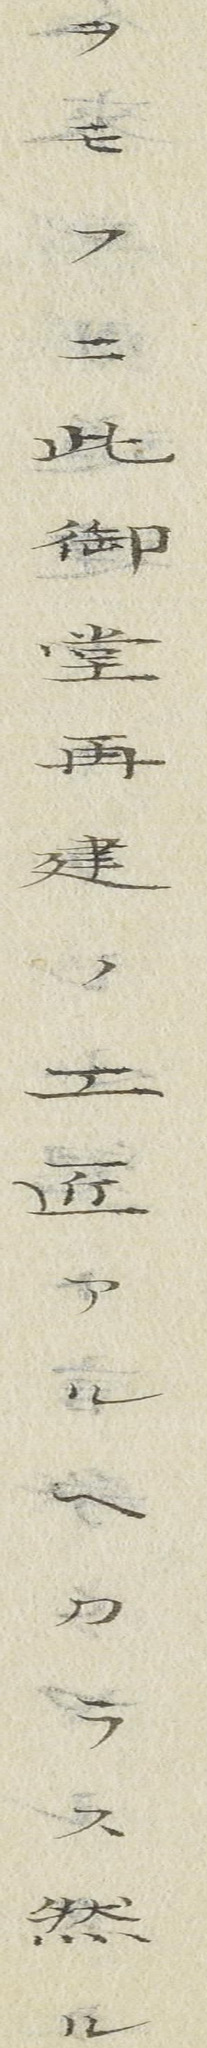ヲモフニ此御堂再建ノ工匠アルヘカラス然ル
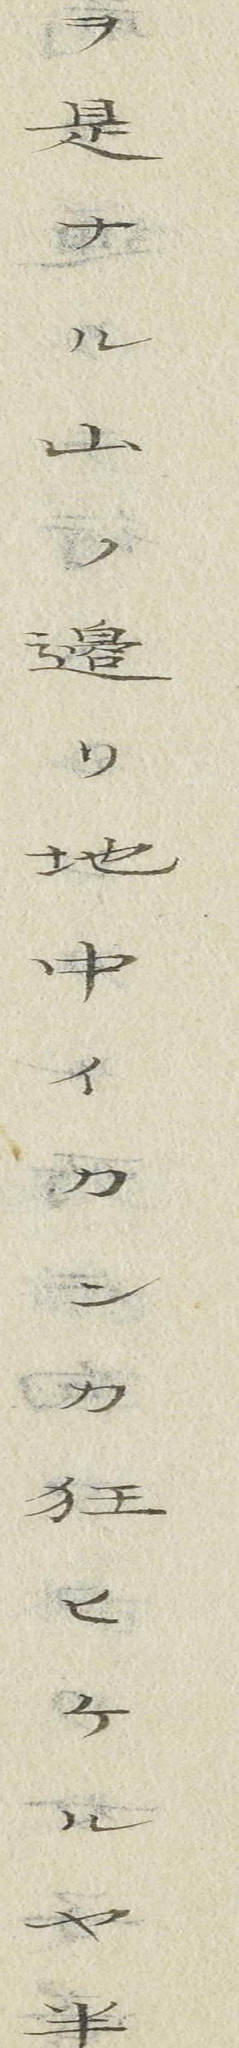ヲ是ナル山ノ辺リ地中イカンカ狂ヒケルヤ半
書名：地災撮要　地震之部　巻ノ二
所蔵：東京大学地震研究所図書室 Earthquake Research Institute Library, The University of Tokyo, JAPAN
